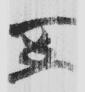五
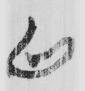㠯（以）
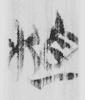相
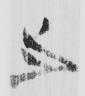之
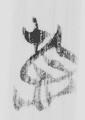惪
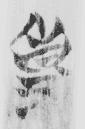事
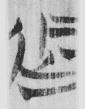{辶殳}
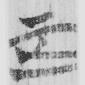正
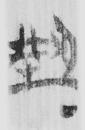型
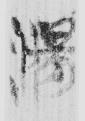湯
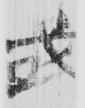或
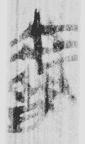{尒䎽}
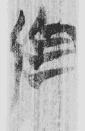於
